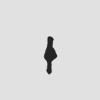十
